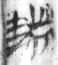○（獵）
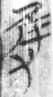隻（獲）
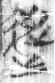逃
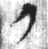人
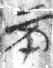不
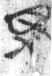○（得）
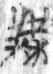無
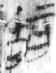○（聞）
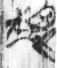執（設）
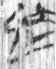罔（網）
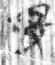○（得）
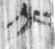大
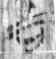吉
